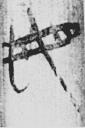母
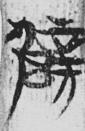辟（嬖）
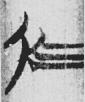於
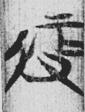便
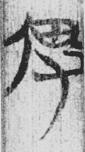俾（嬖）
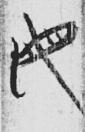母
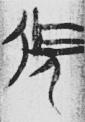倀（長）
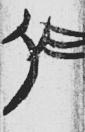於
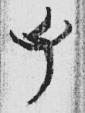父
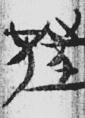○（兄）
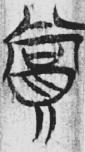賞
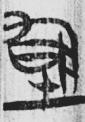○（均）
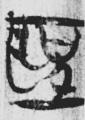聖（聽）
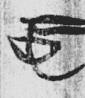𠁩
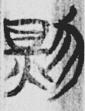則
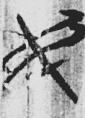民
